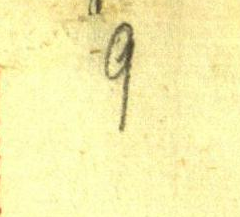9
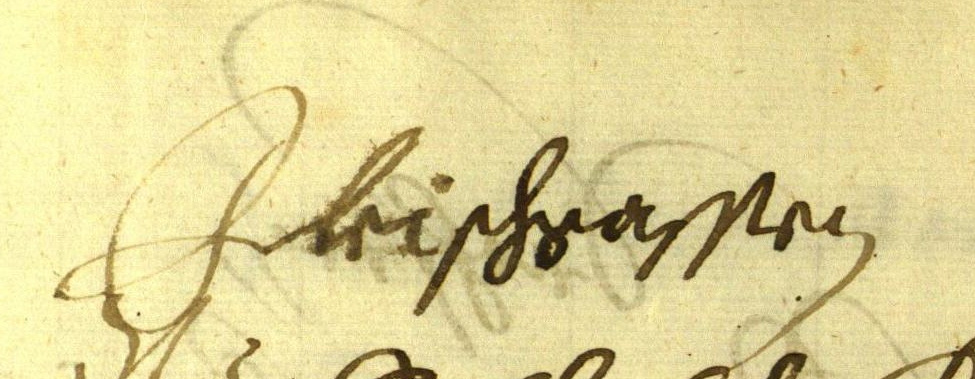Fleischgassen
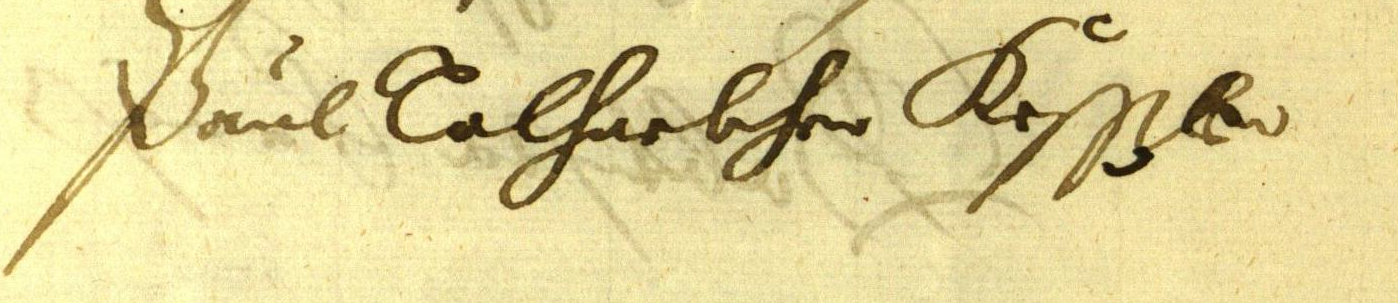Paūl Talhackher Kesßler
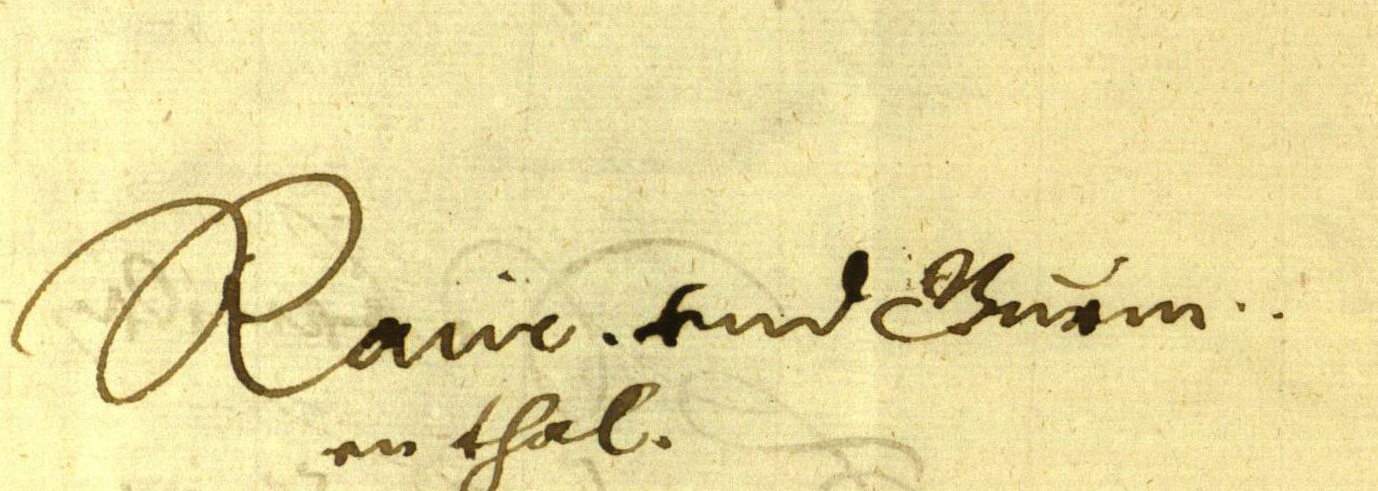Rain. vnd Gūrm¬
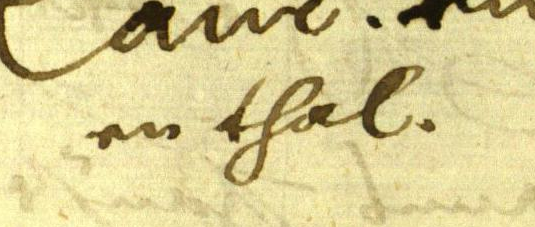en thal.
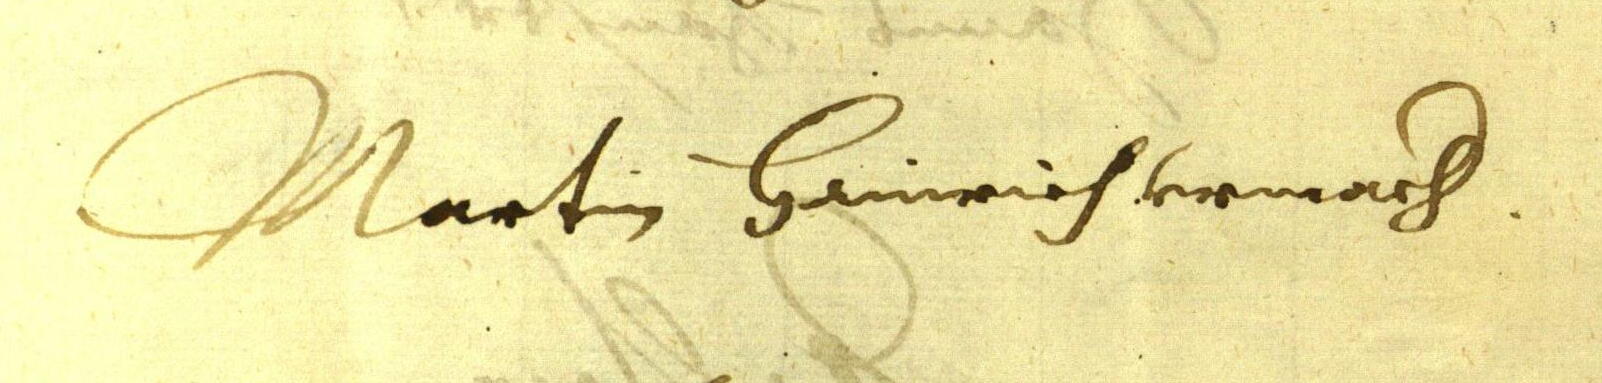Martin Hainrich vrmach.
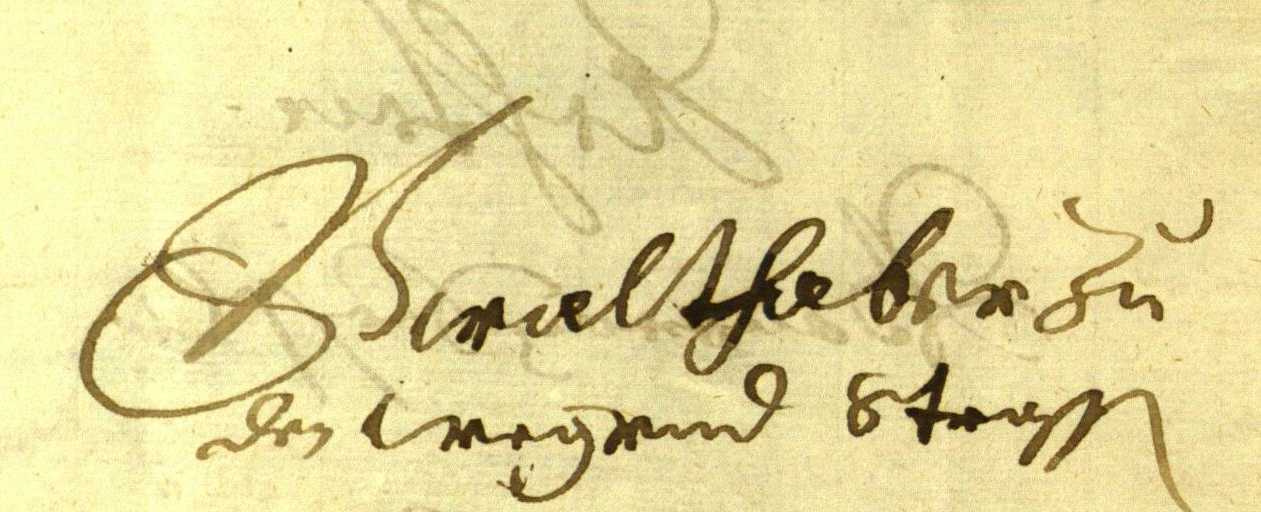Gwalthaber Zū
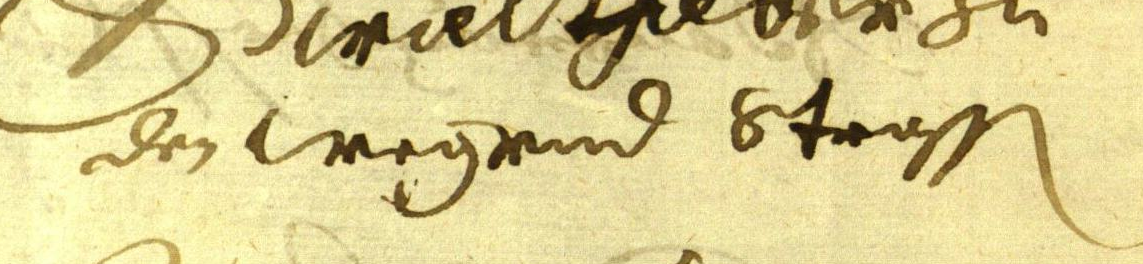den weg vnd Strass
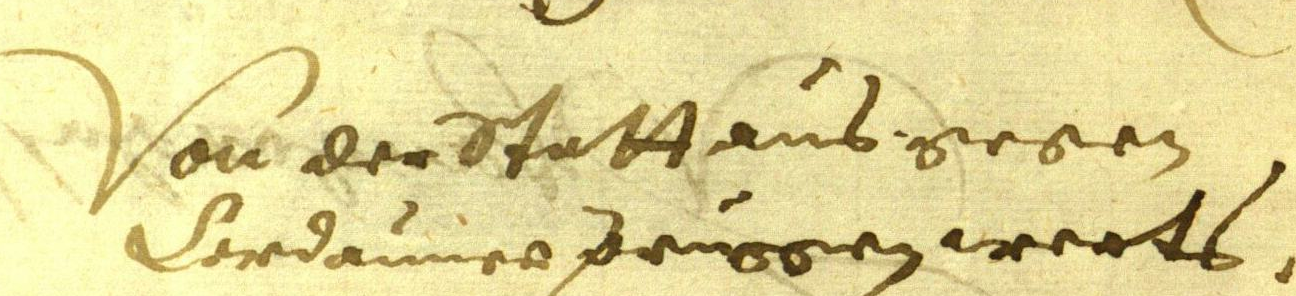Von der Statt aūs gegen
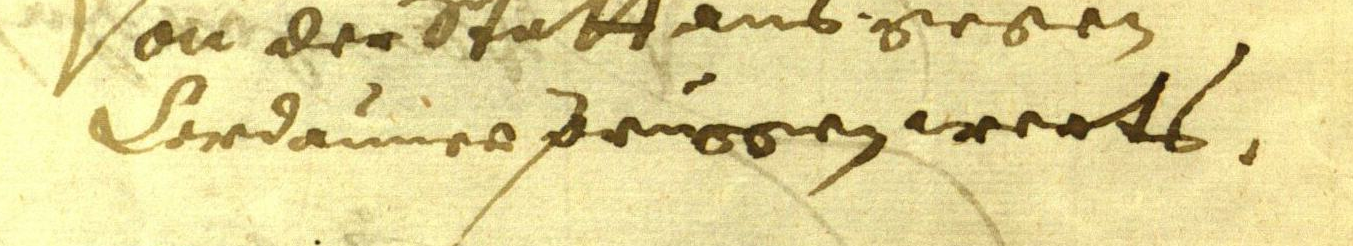Cardaūner Prūggen werts.
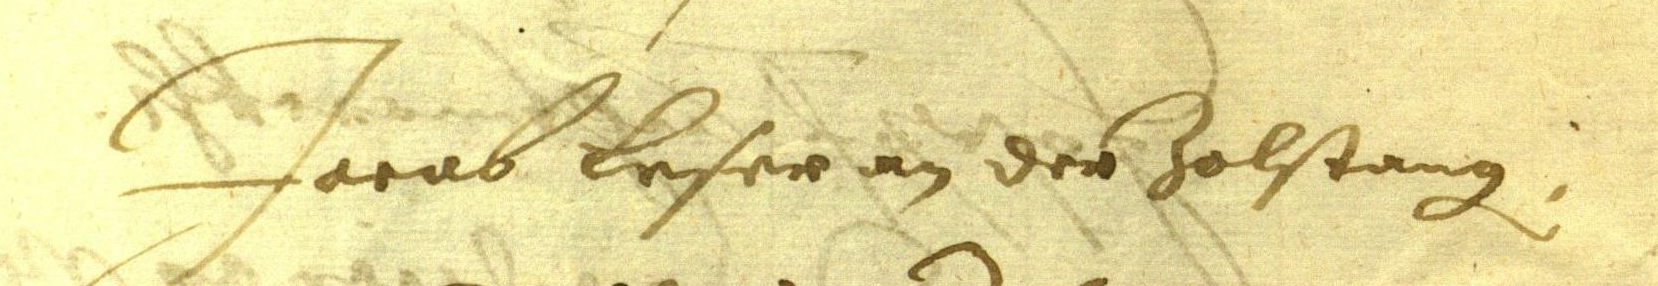Jacob Leser an der Zolstang.
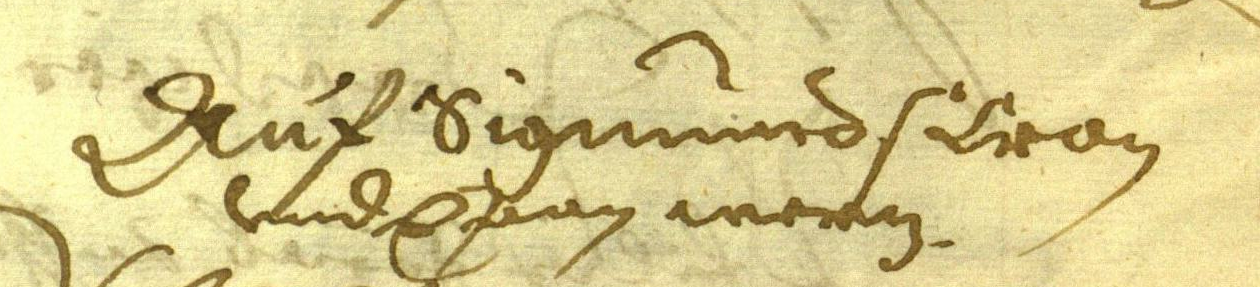Aūf Sigmūnds Cron
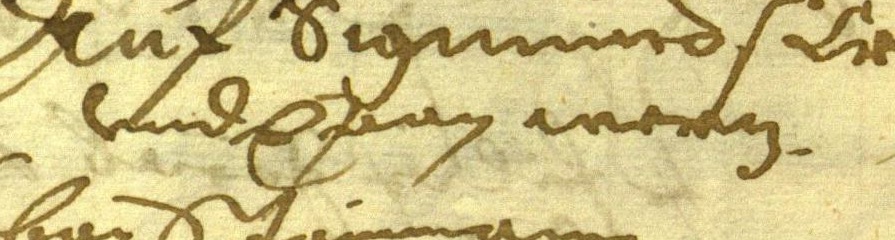vnd Epan werz.
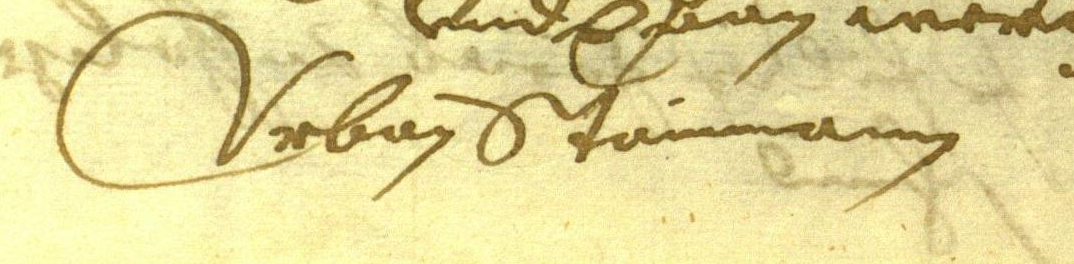Vrban Stainmann
